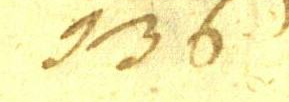136
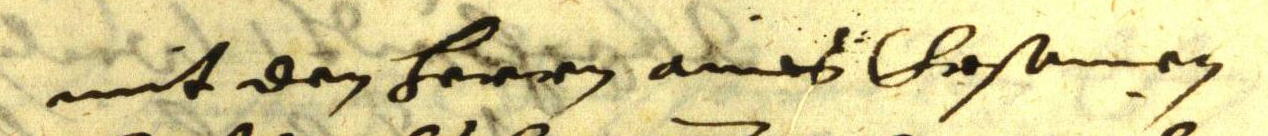mit den herrn aines Ersamen
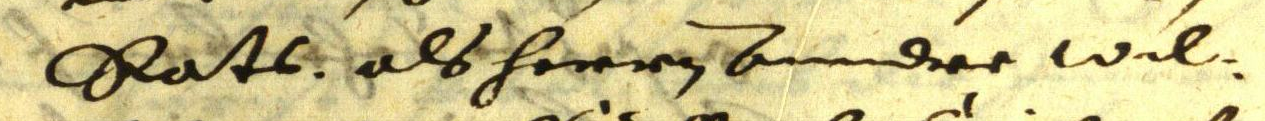Rats. als herrn Anndre Wil¬
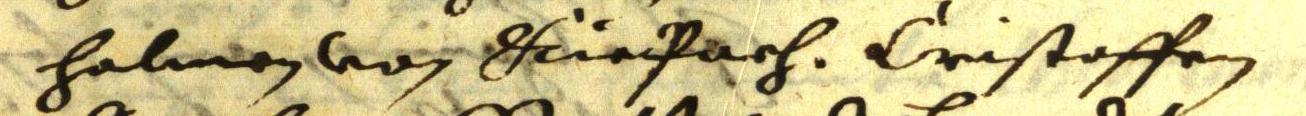halmen von KiePach. Cristoffen
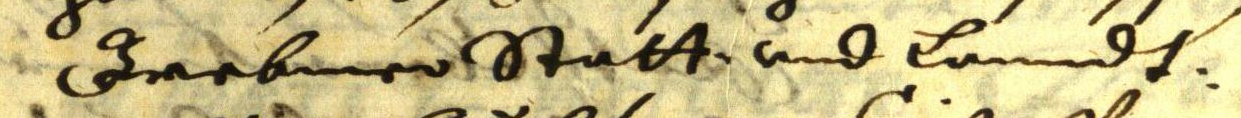Grebmer Statt: vnd Lanndt¬
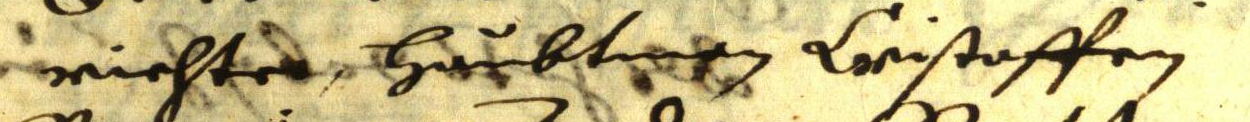richter, Haūbtman Cristoffen
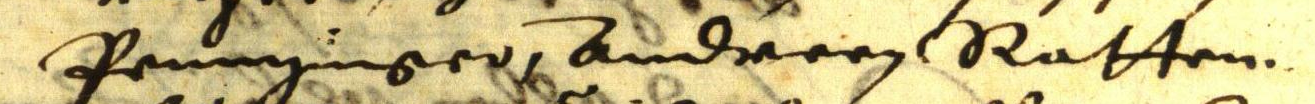Pennzinger, Andreen Rotten¬
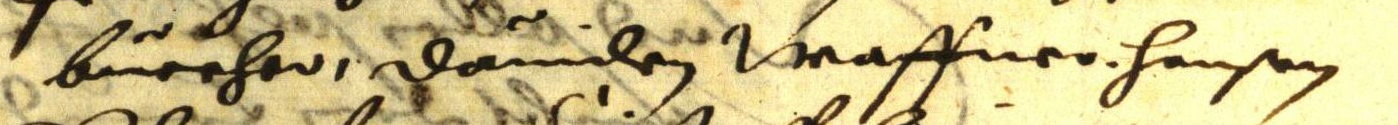būecher, Daūiden Waffner. hansen
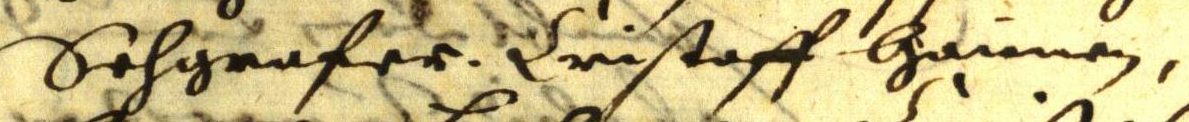Schgrafer. Cristoff Haimen,
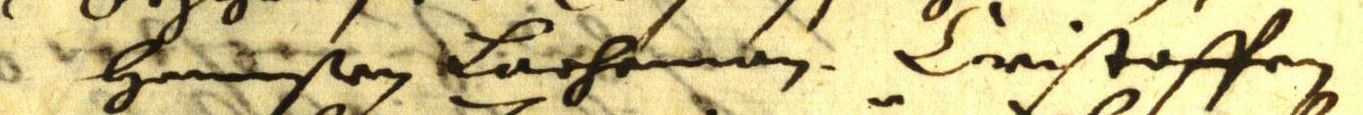Hannsen Locheman. Cristoffen
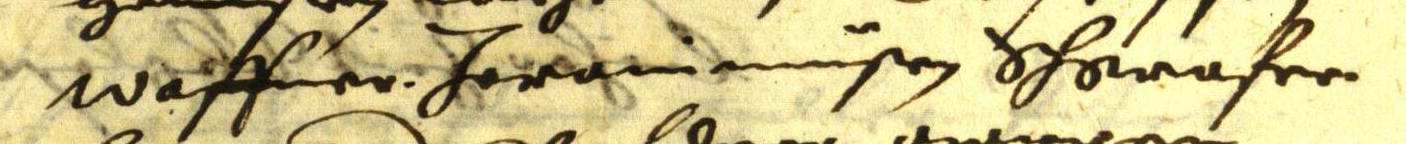Waffner. Jeronimūsen Schgrafer,
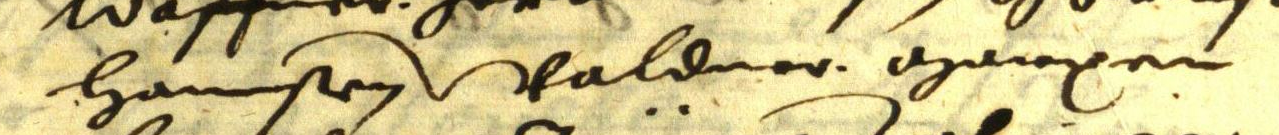Hannsen Waldner. Marxen
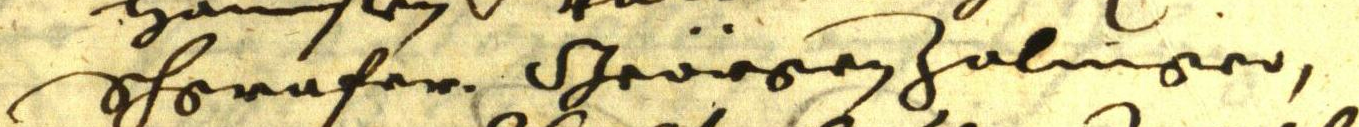Schgrafer. Geörgen Zalinger,
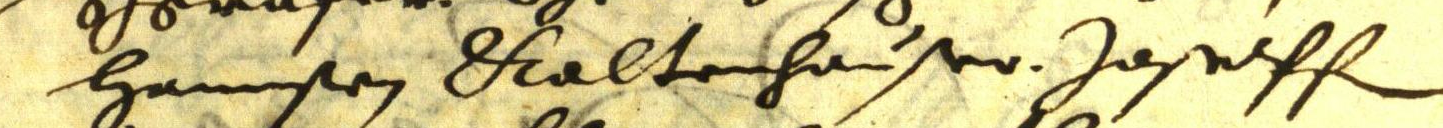Hannsen Kaltenhaūser. Joseff
